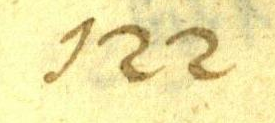122
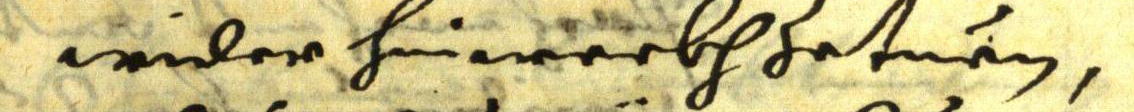wider hinweckh Zetūen,
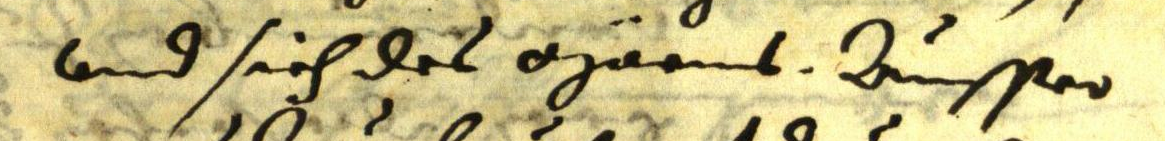vnd sich des Mäens. Aūsser
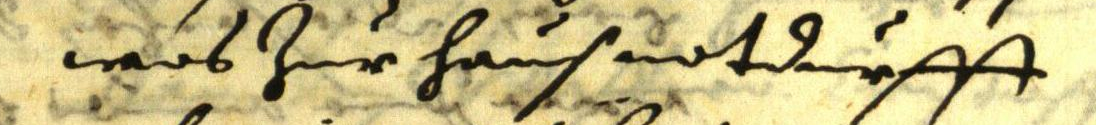was Zūr haūsnotdūrfft
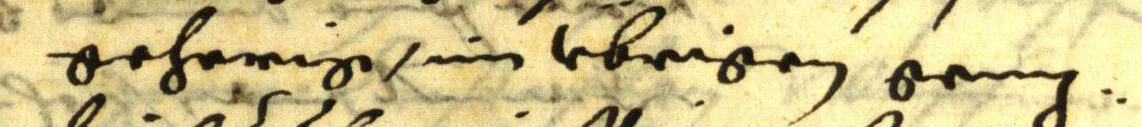geherig, im v̈brigen genz¬
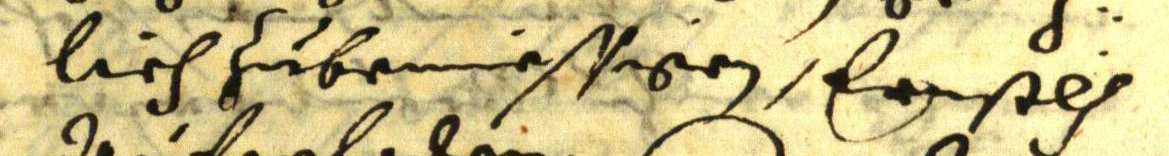lich Zūbemiessigen, Ernstlich
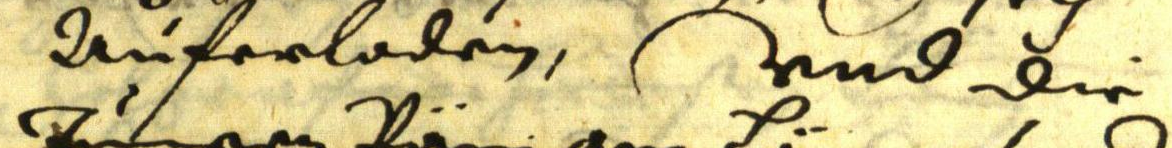Aūferladen, Vnd die
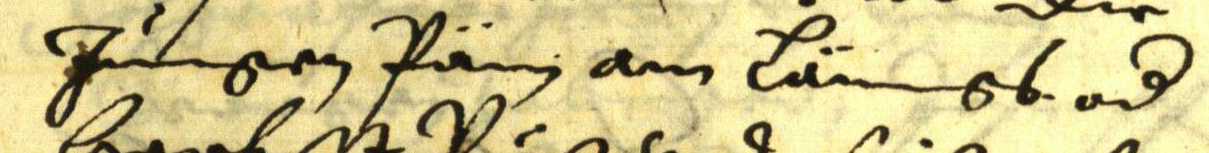Jūngen Päm am Länngs. od
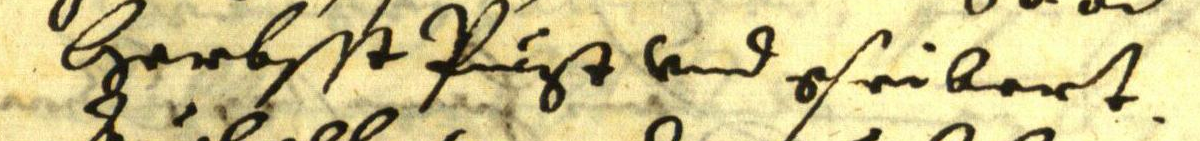Herbsst Pūzt vnd gseibert.
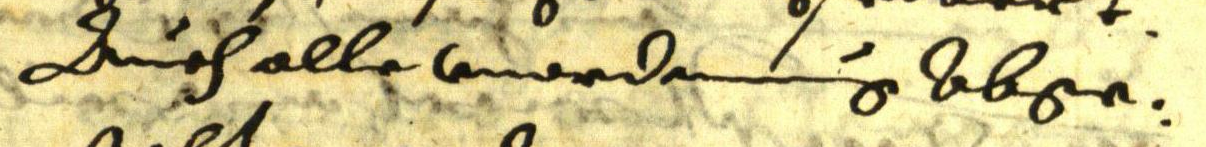Aūch alle vnordnūng Abge¬
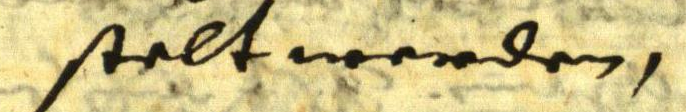stelt werden,
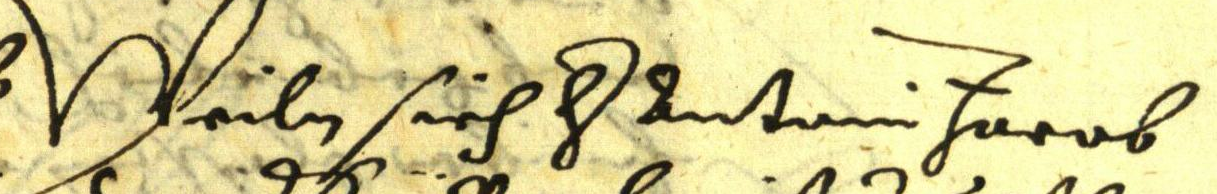Weiln sich h Antoni Jacob
